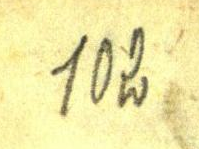102
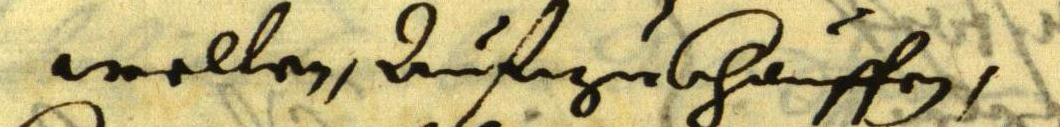wellen, Aūfzūkhaūffen,
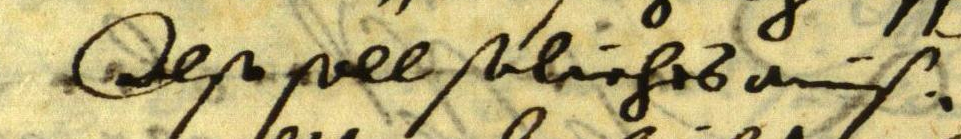Also soll soliches ains¬
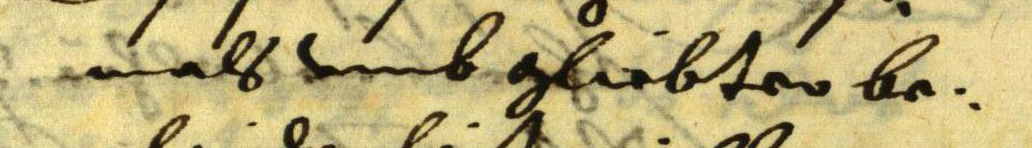mals vmb gliebter be¬
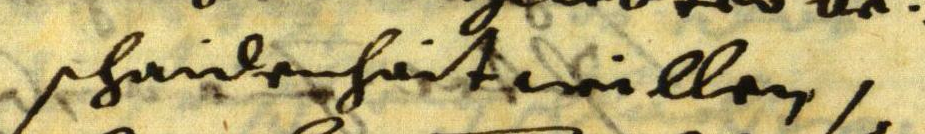schaidenhait willen,
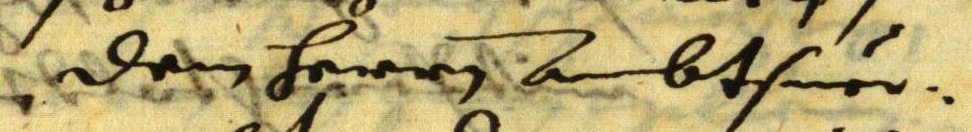dem herrn Ambtsver¬
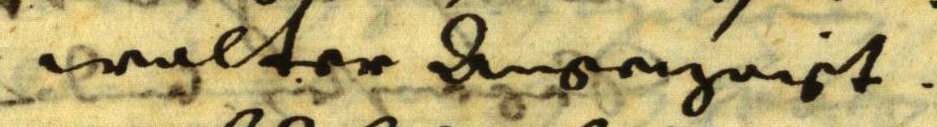walter Angezaigt.
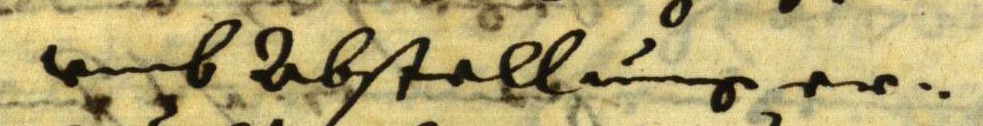vmb Abstellūng er¬
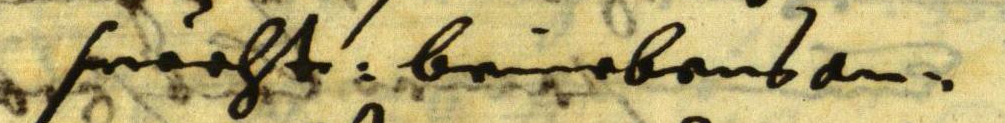sūecht: beinebens an¬
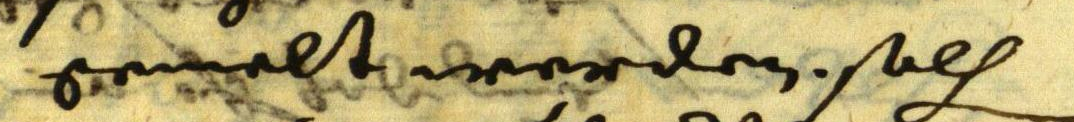gemelt werden. solh
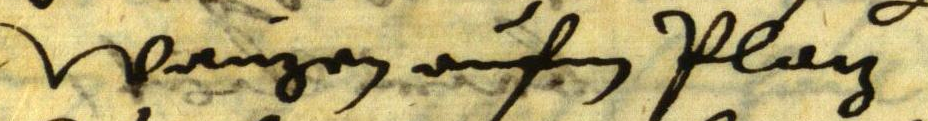Waizen aūfm Plaz
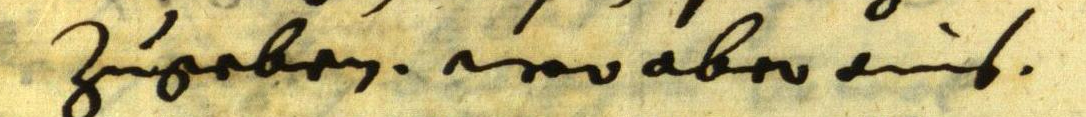Zūgeben. wer aber ains.
